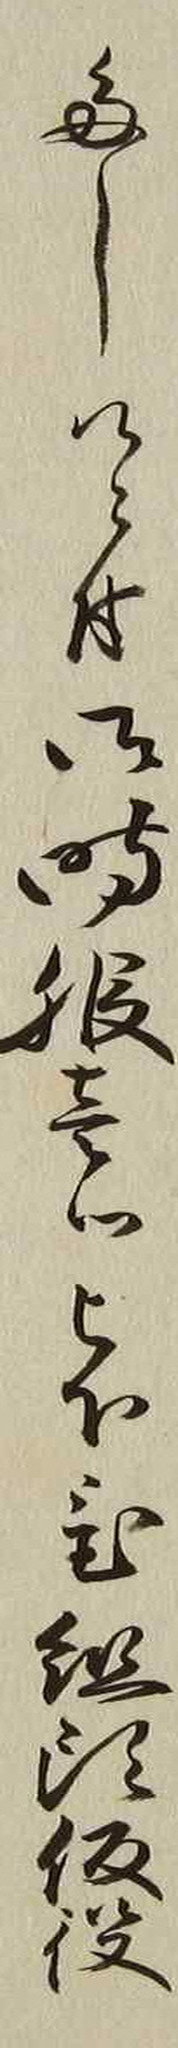たし候ニ付御時服壱ツ被下置組頭仮役
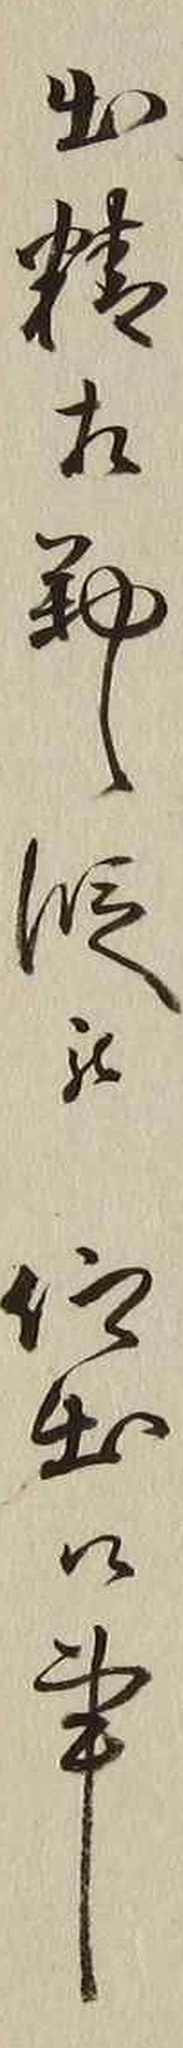出精相勤候段被仰出候事

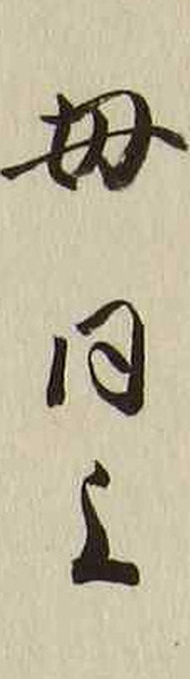母同上
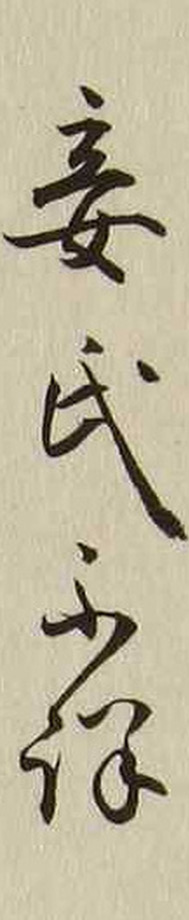妾氏不詳
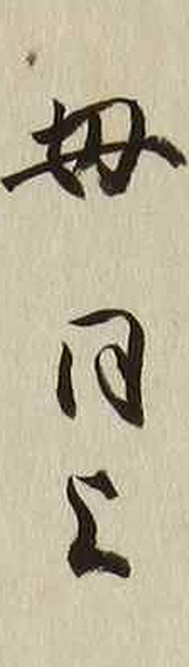母同上
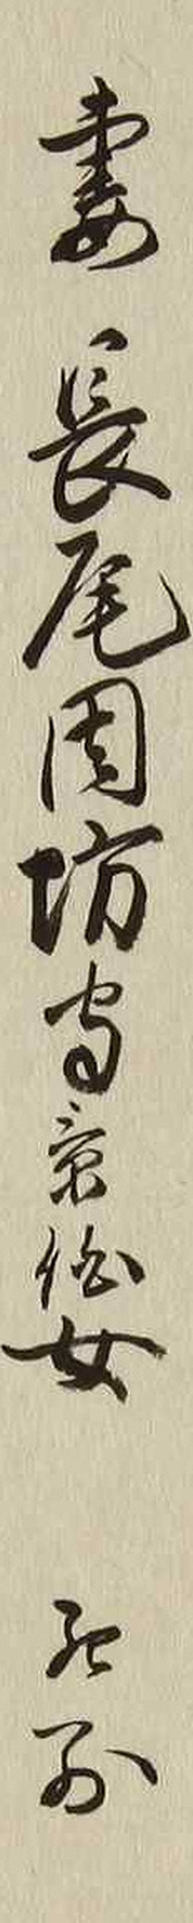妻長尾周坊守景伯女死別
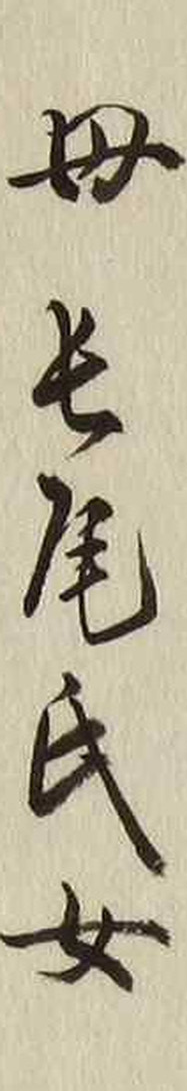母長尾氏女
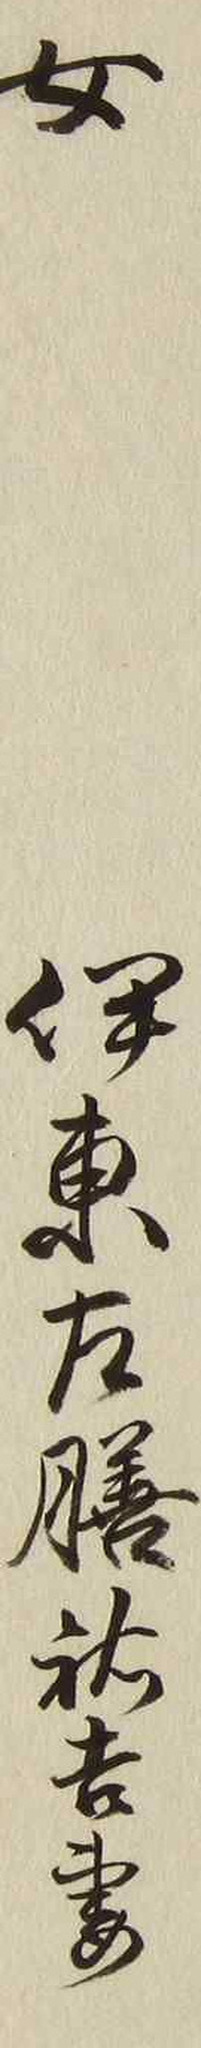女伊東左膳祐吉妻
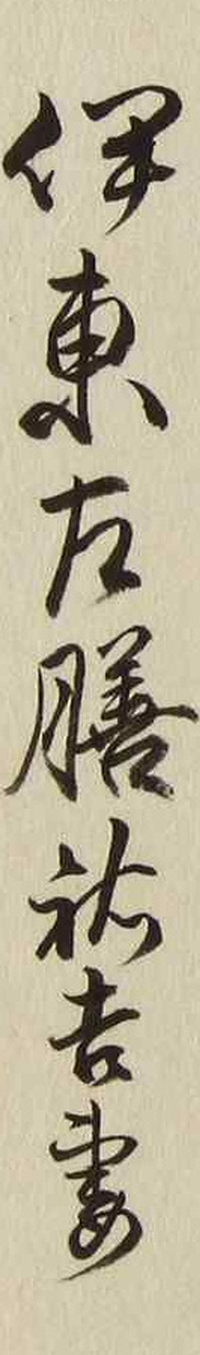女伊東左膳祐吉妻
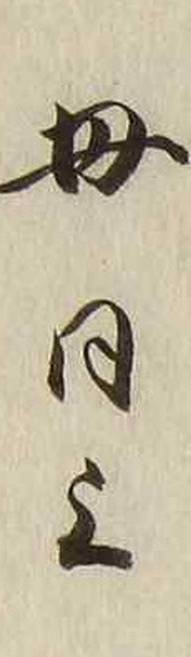母同上

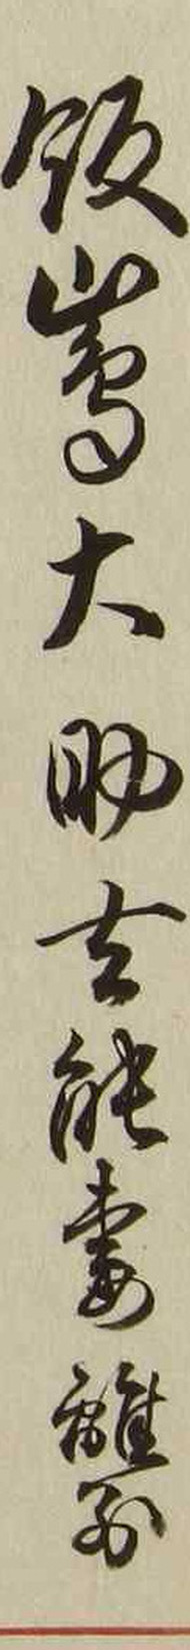飯島大助玄能妻離別
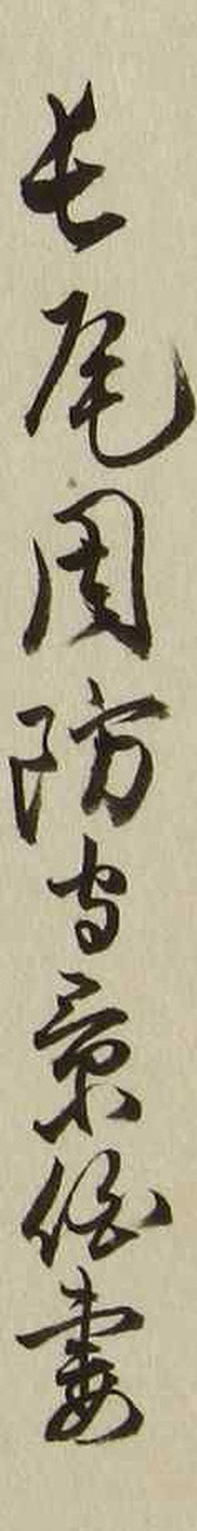女長尾周防守景伯妻
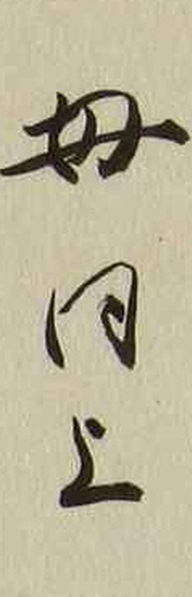母同上
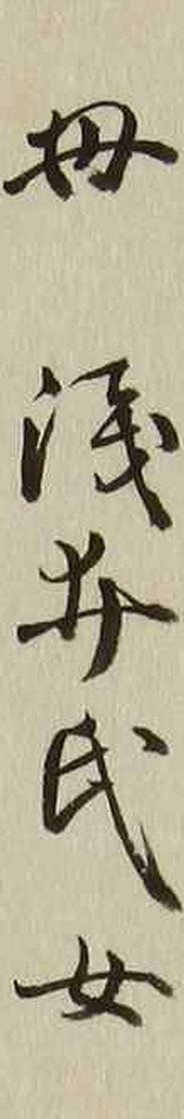母浅井氏女
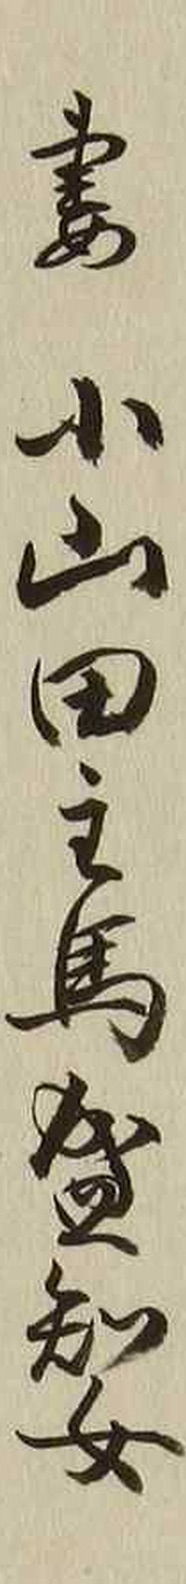妻小山田主馬盛知女
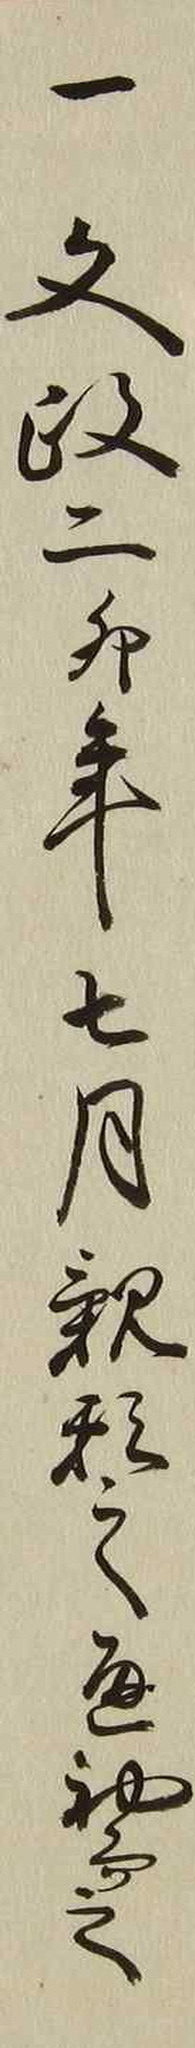一文政二卯年七月親願之通初而之
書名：諸士系譜　巻之15　い之部15
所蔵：会津若松市立会津図書館
